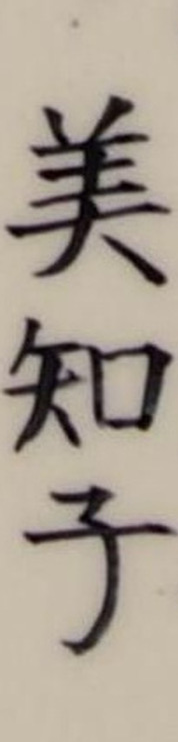美知子
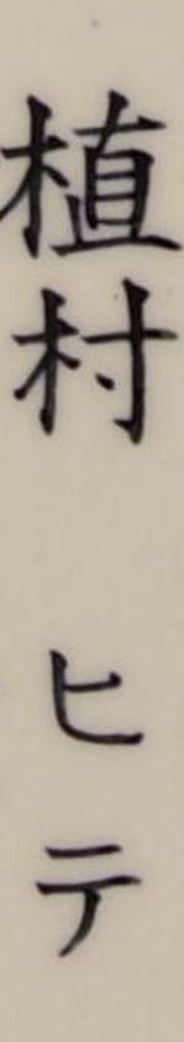植村ヒテ
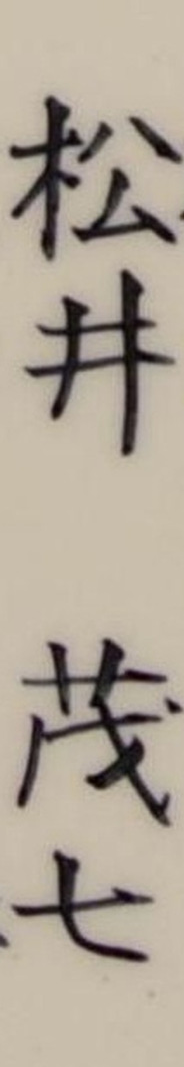松井茂七
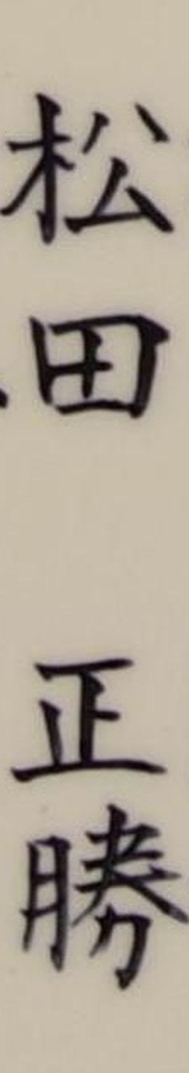松田正勝
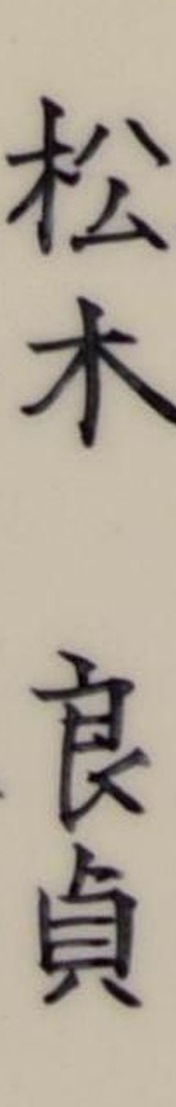松木良貞
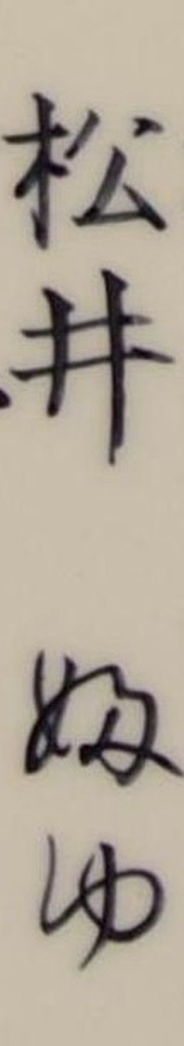松井ふゆ
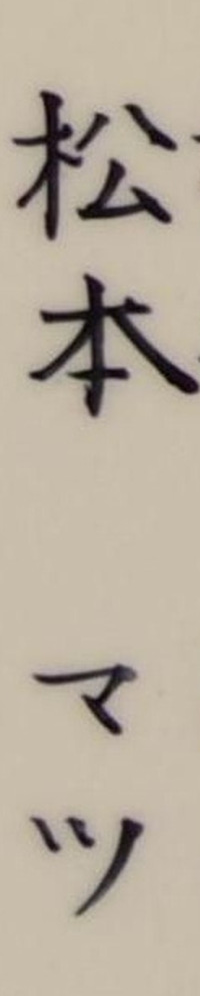松本マツ
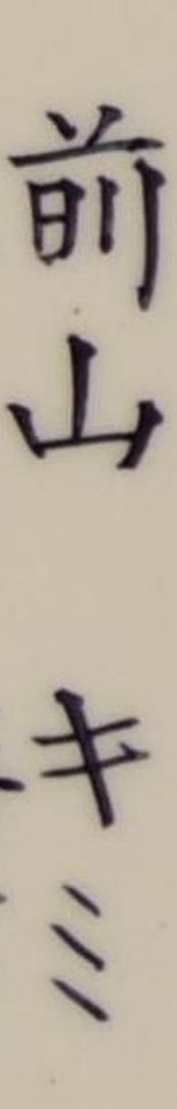前山キミ
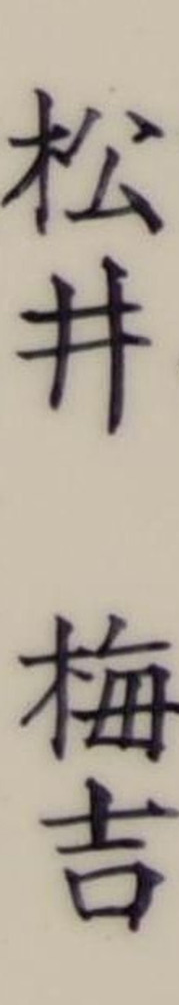松井梅吉
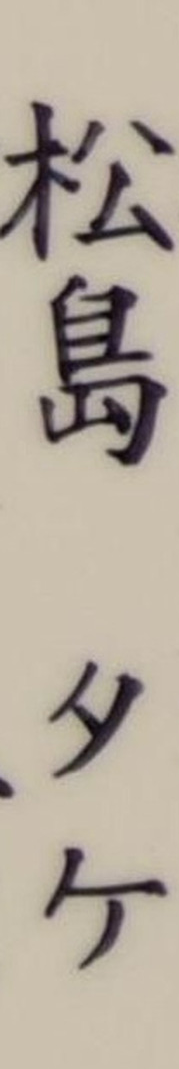松島タケ
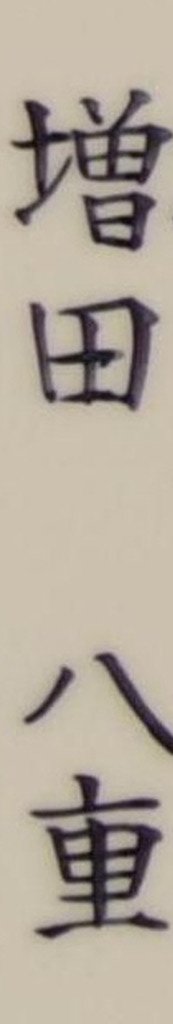増田八重

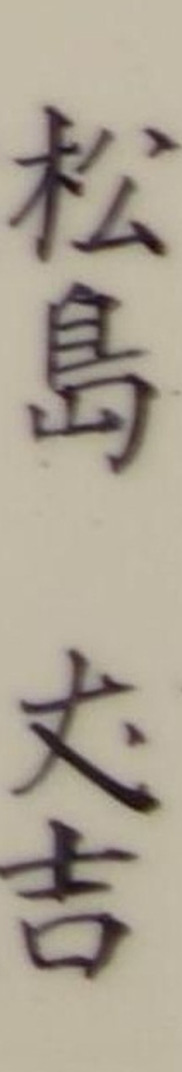松島丈吉
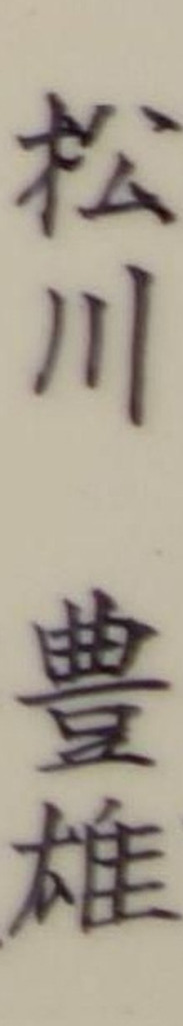松川豊雄
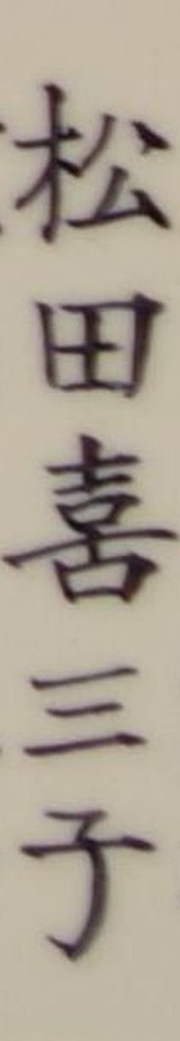松田喜三子
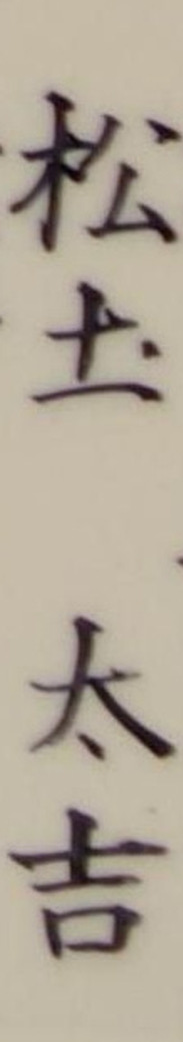松土太吉
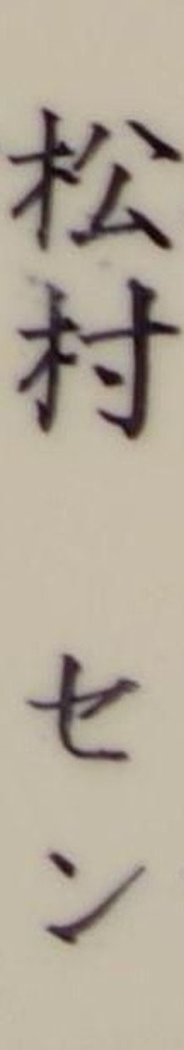松村セン
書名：M~S
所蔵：高野山金剛峯寺
